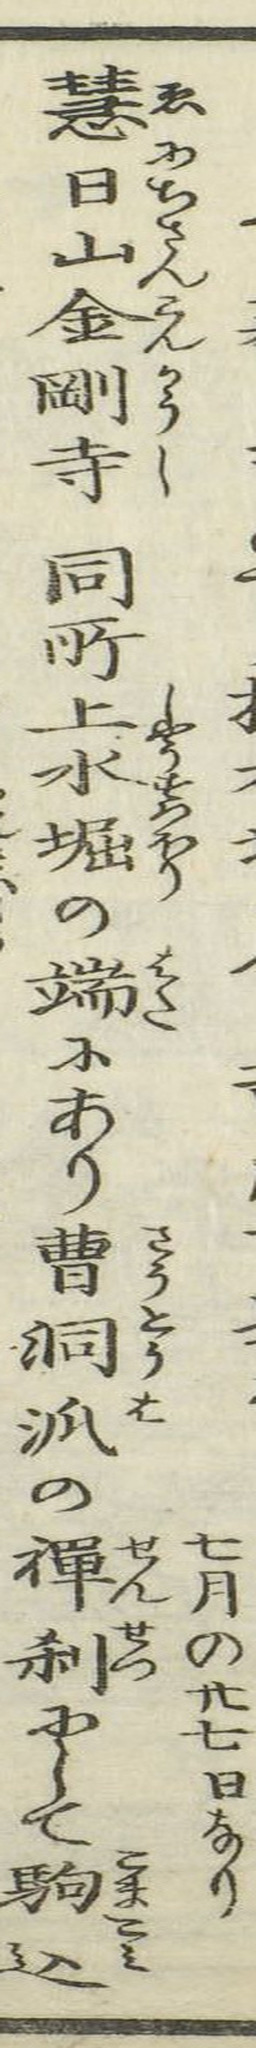慧日山金剛寺同所上水堀の端にあり曹洞派の禪刹にして駒込
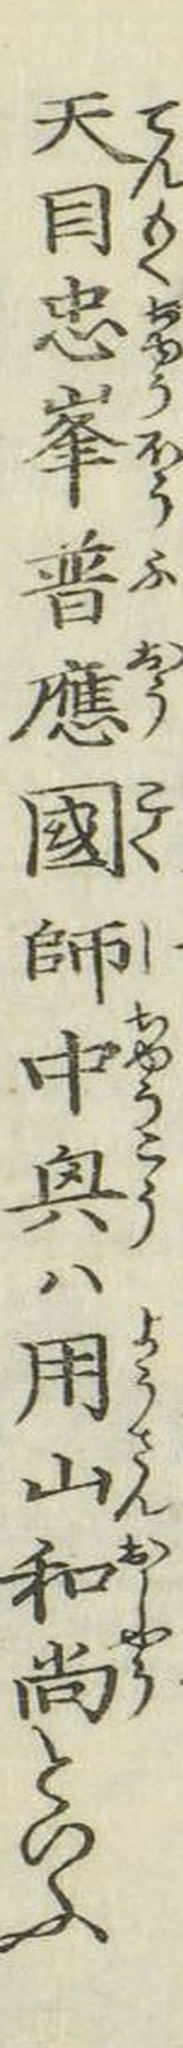天目忠峯普應國師中興は用山和尚といふ
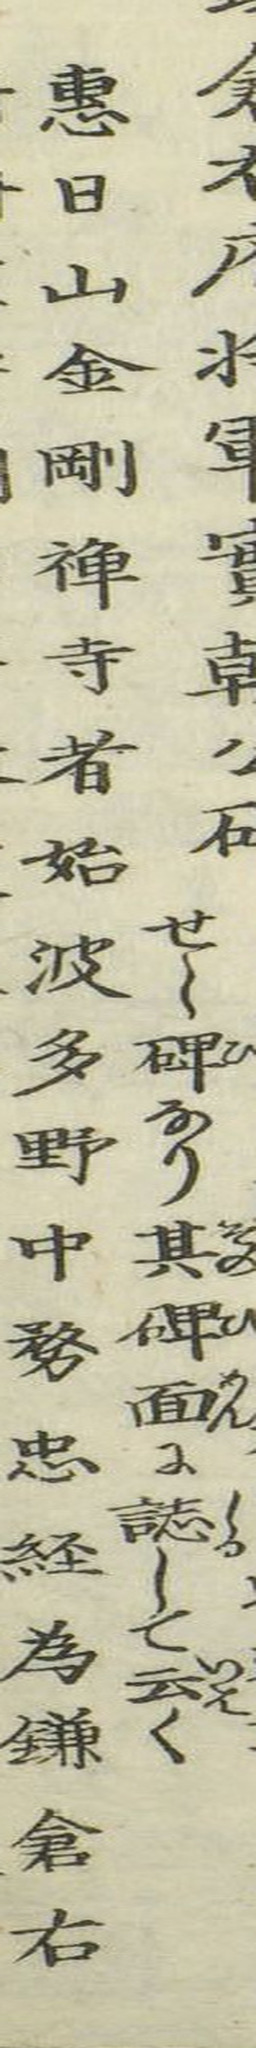惠日山金剛禅寺者始波多野中務忠経為鎌倉右
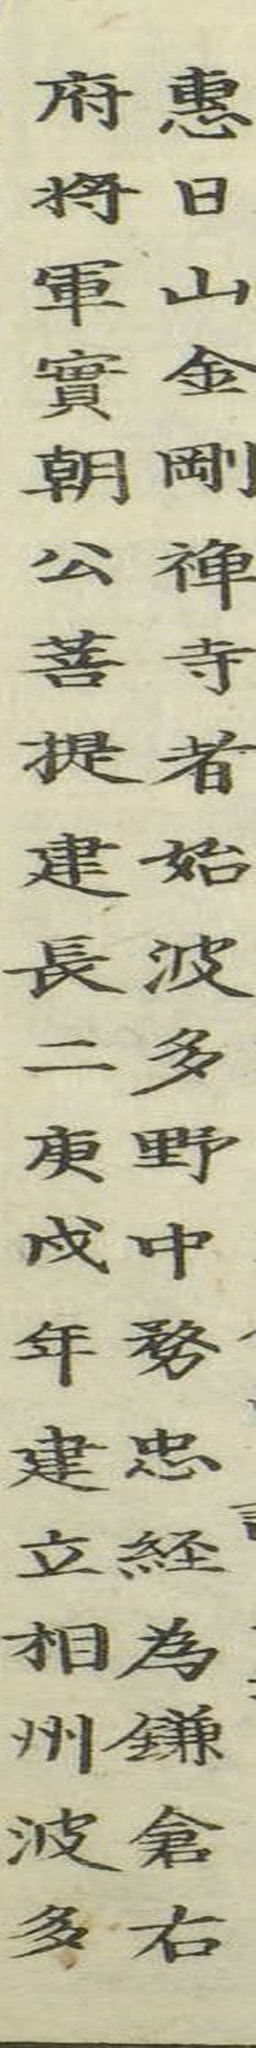府將軍實朝公菩提建長二庚戌年建立相州波多

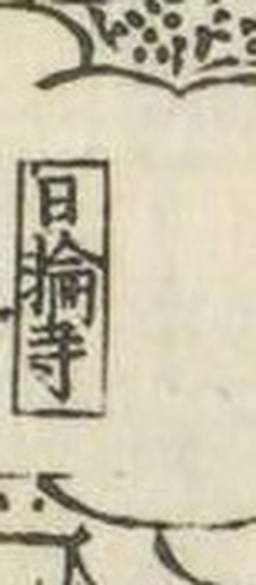日輪寺

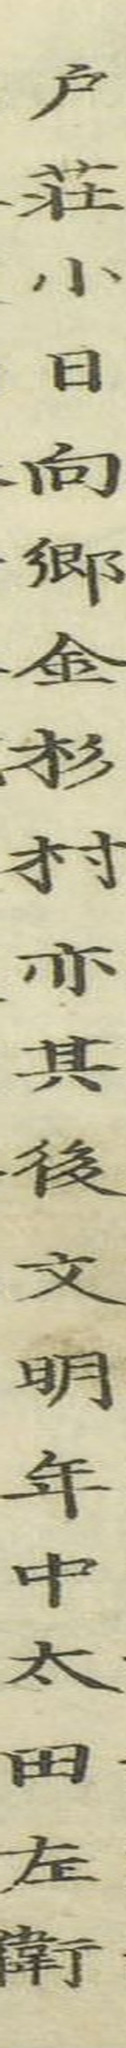戸荘小日向郷金杉村亦其後文明年中太田左衛
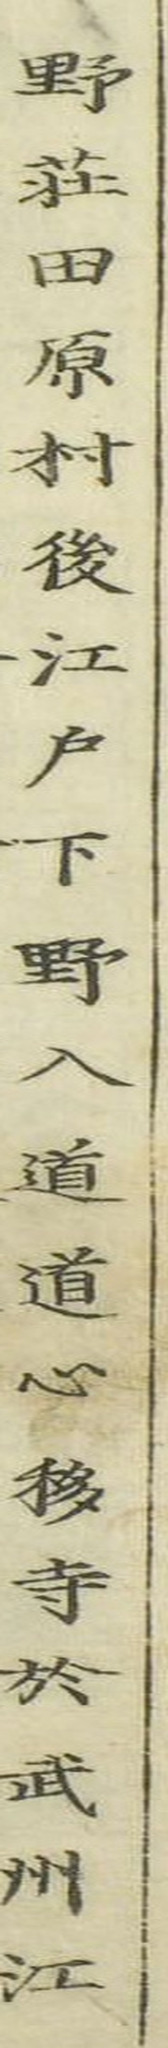野荘田原村後江戸下野入道道心移寺於武州江
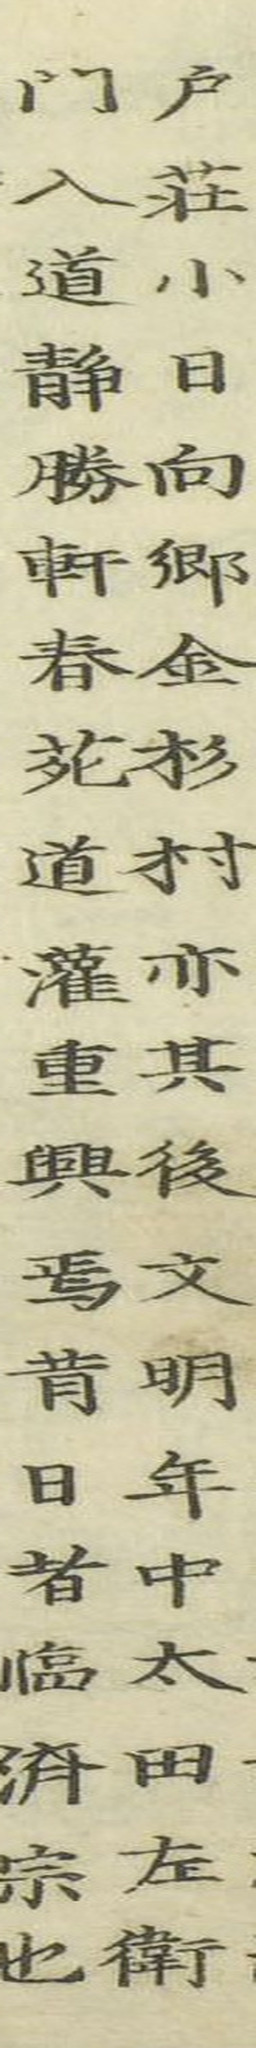門入道静勝軒春苑道灌重興焉昔日者臨済宗也
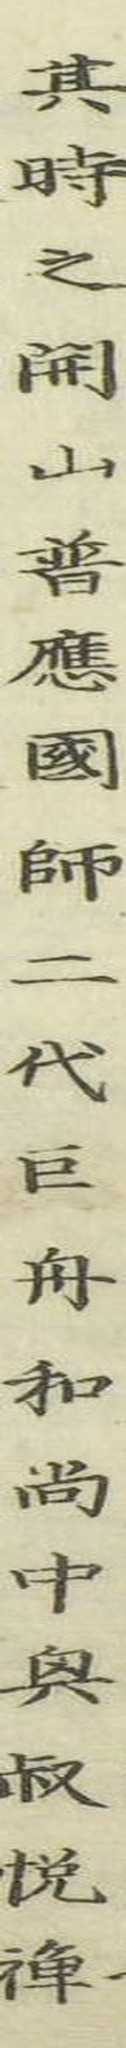其時之開山普應國師二代巨舟和尚中興叔悦禅
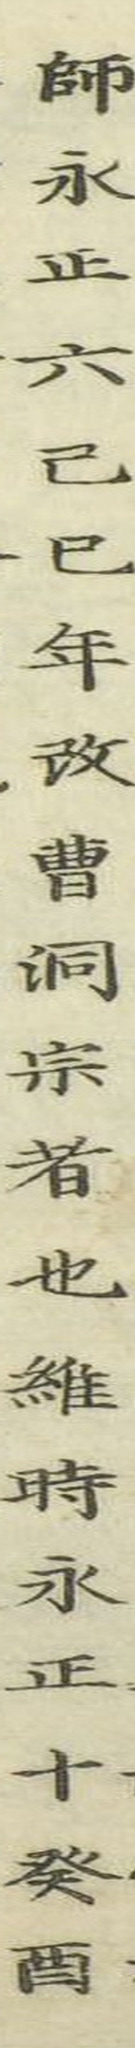師永正六己巳年改曹洞宗者也維時永正十癸酉
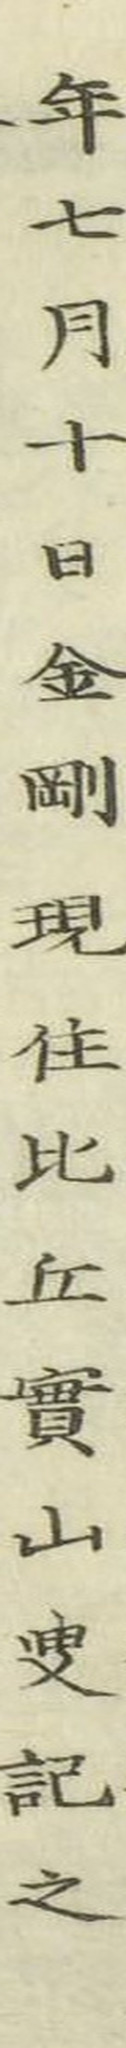年七月十日金剛現住比丘實山叟記之
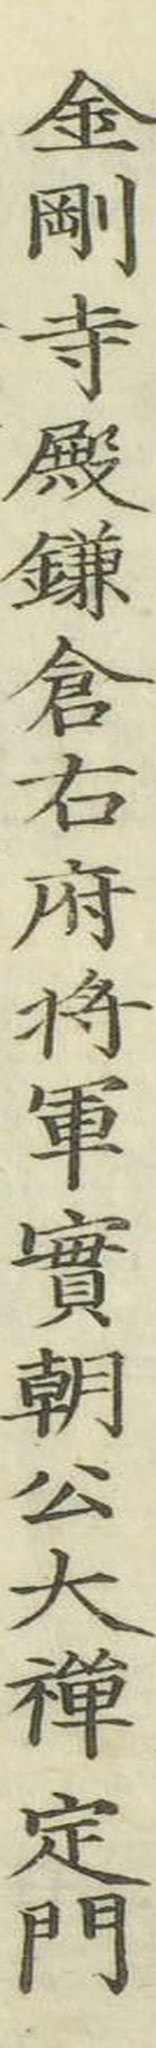金剛寺殿鎌倉右府將軍實朝公大禪定門
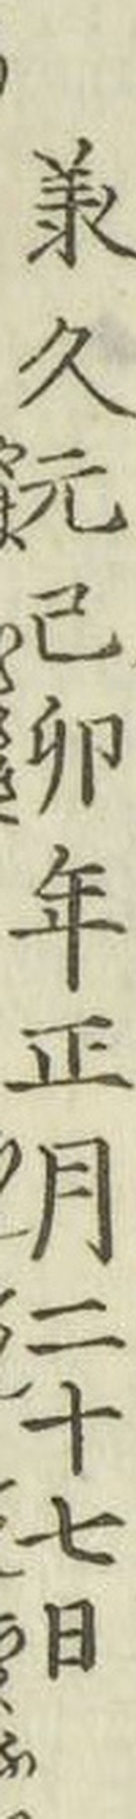承久元己卯年正月二十七日
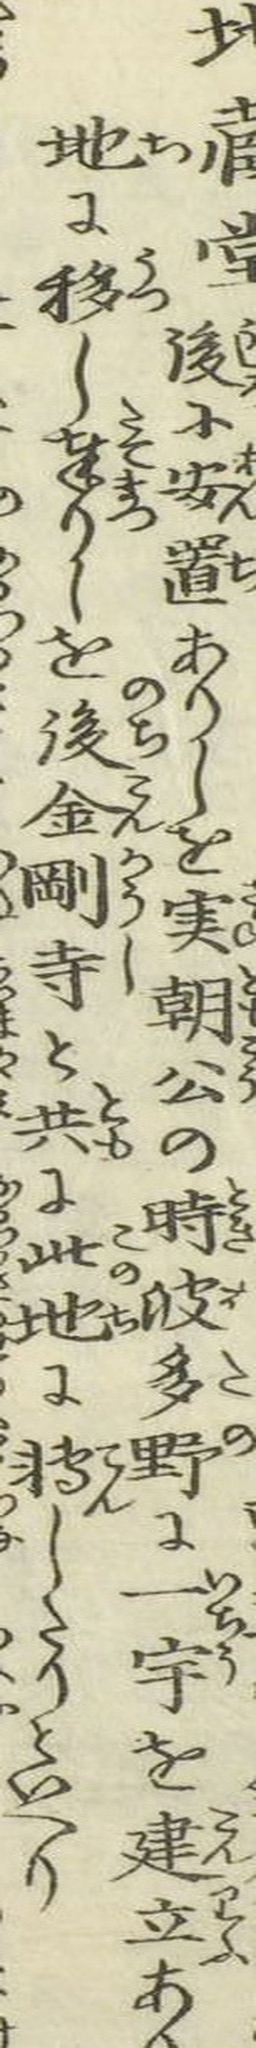地に移し奉りしを後金剛寺と共に此地に轉したりといへり
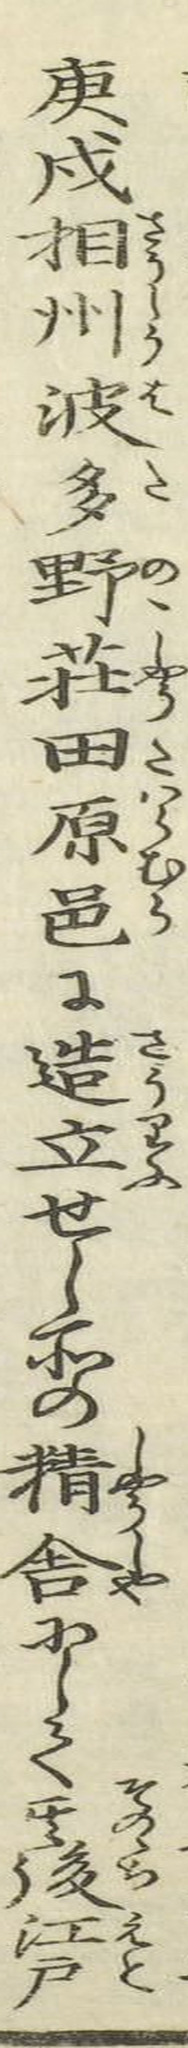庚戌相州波多野荘田原邑に造立せし所の精舎にして其後江戸
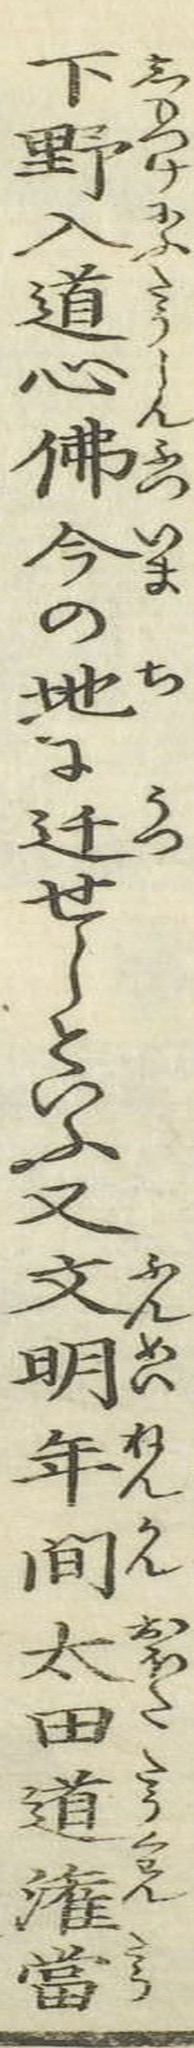下野入道心佛今の地に迁せしといふ又文明年間太田道灌當
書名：江戸名所図会 20巻 巻之12
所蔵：東京学芸大学教育コンテンツアーカイブ
